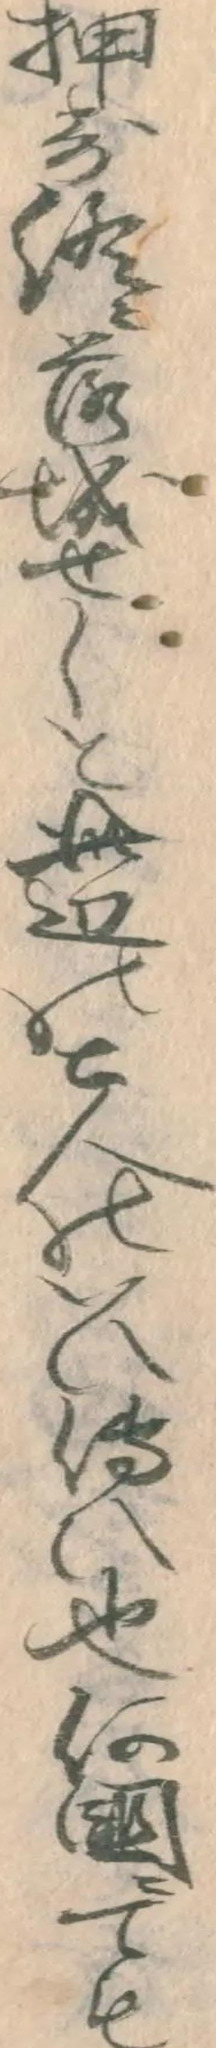押寄終に落城せしと此辺の土人のいひ伝ひ也何国にても
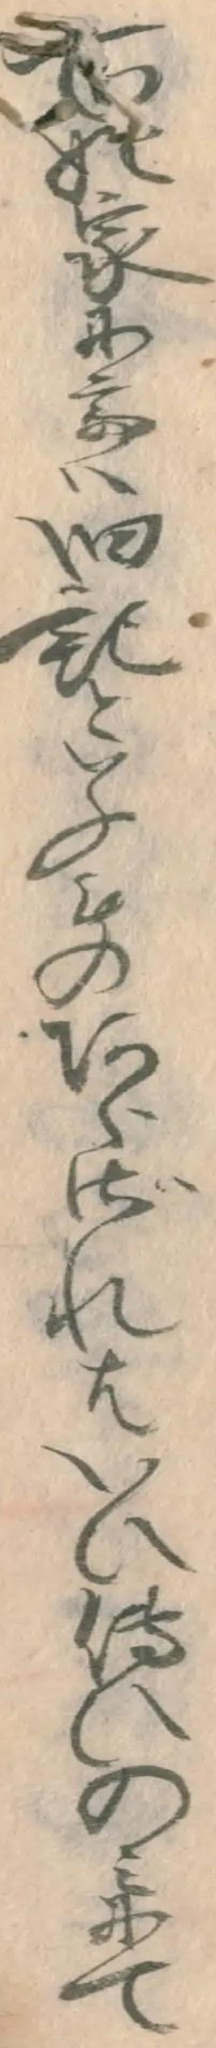百姓家にては旧記といふものあらざれ共いひ伝ひのみにて

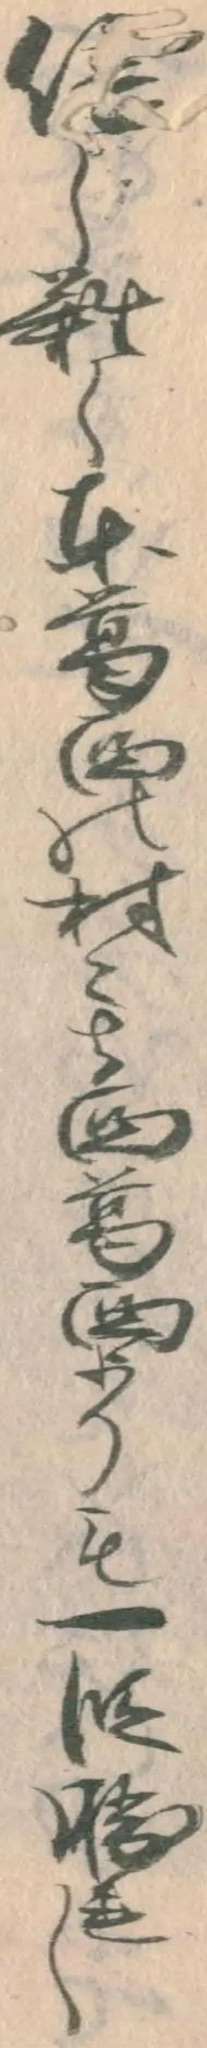信じ難し東葛西の村々は西葛西よりも一段勝れし
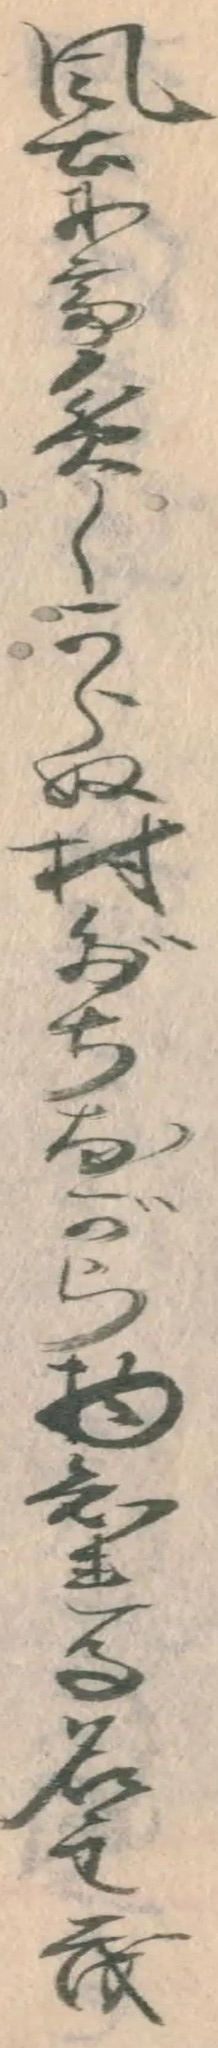風土にて貧しからぬ村だちながら物知れる名主も
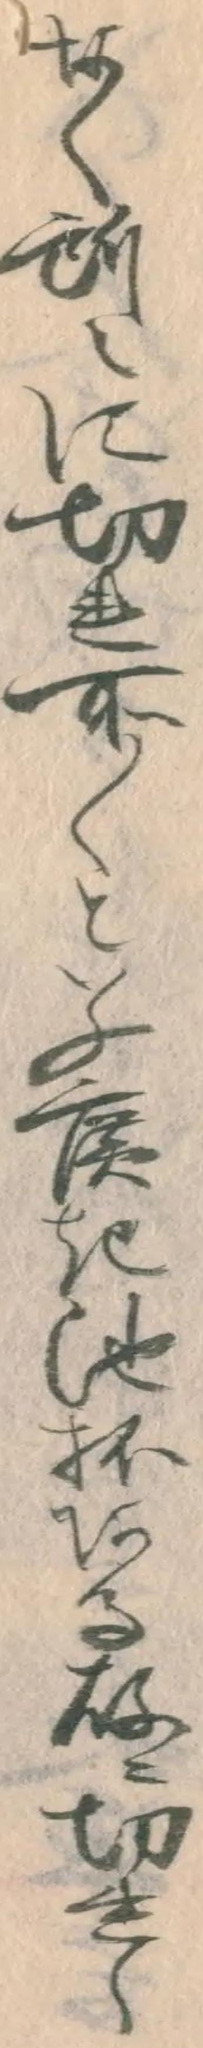なく所々に切れ所〳〵といふ広き池抔ある故に切れし
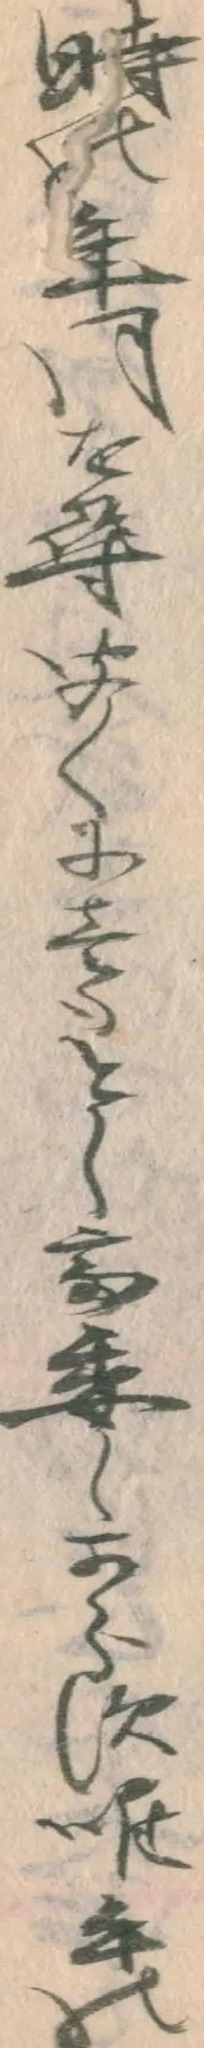時の年月を尋聞くに壱つとして委しからす唯午の
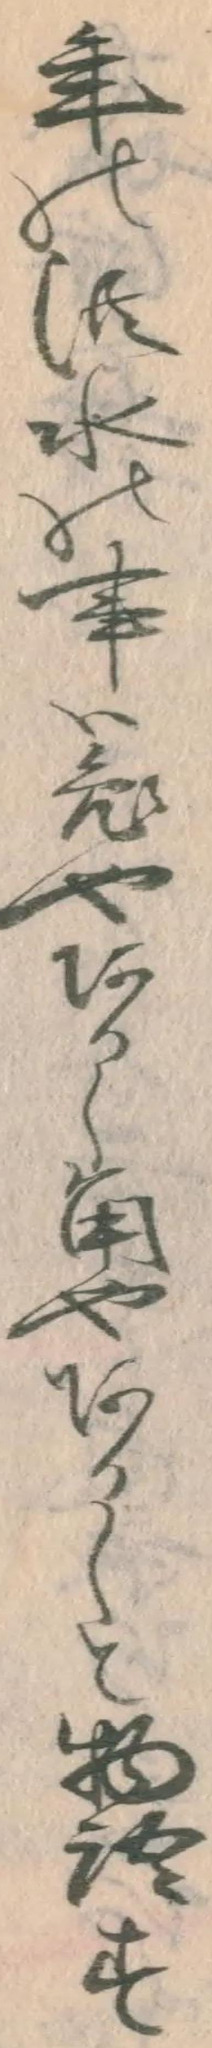年の洪水の事は兎やあるし角やありしと物語す
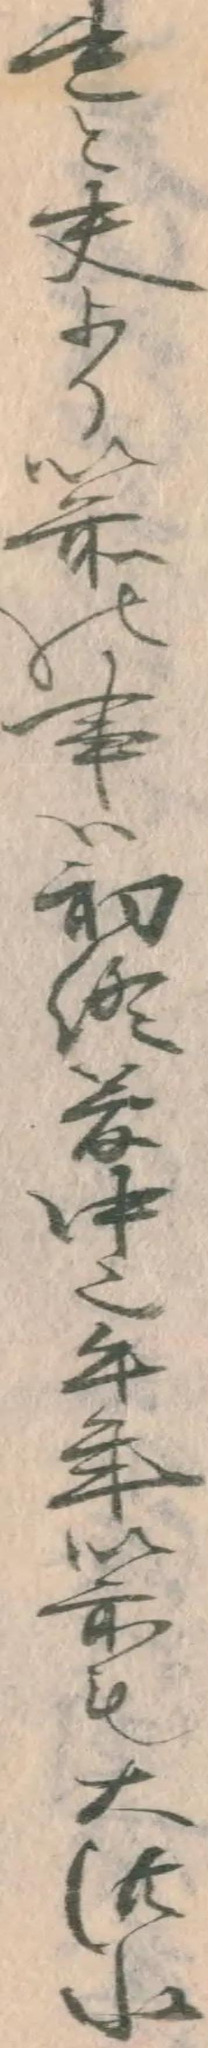れと夫より以前の事は初終夢中也午年以前も大洪水
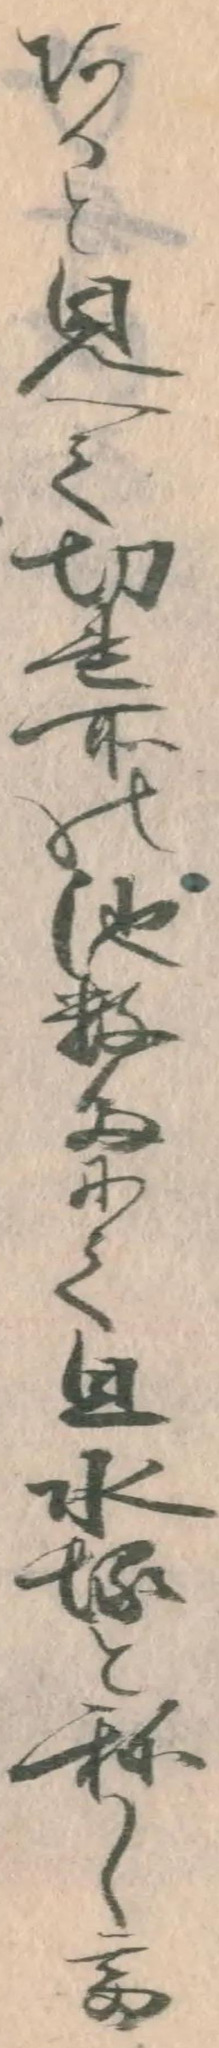あると見へて切れ所の池数多にて且水塚と称して
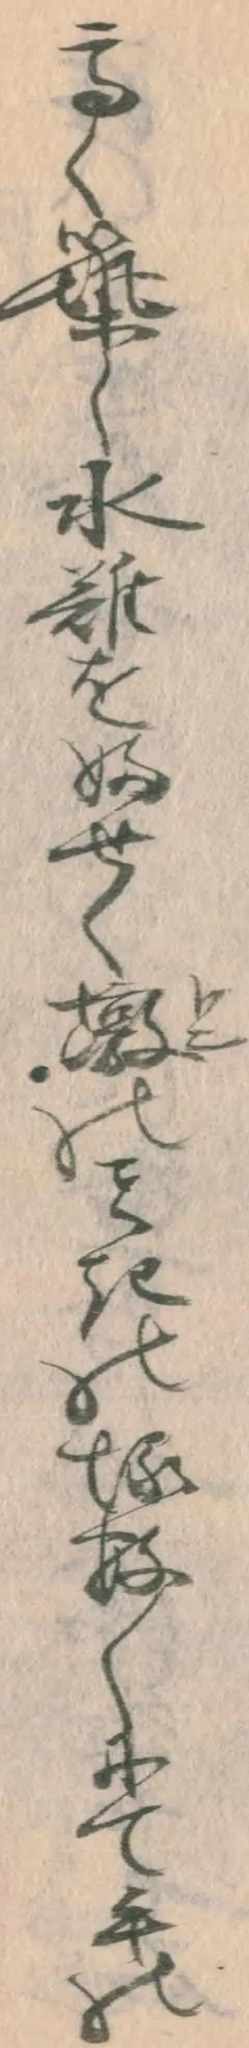高く築し水難をふせく墩のこときの塚数〳〵にて午の
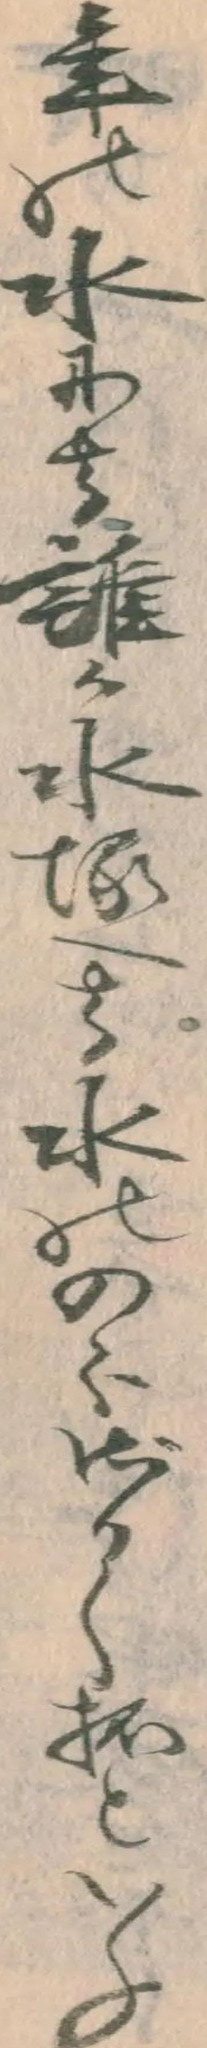年の水には誰か水塚へは水ののらさりし抔といふ
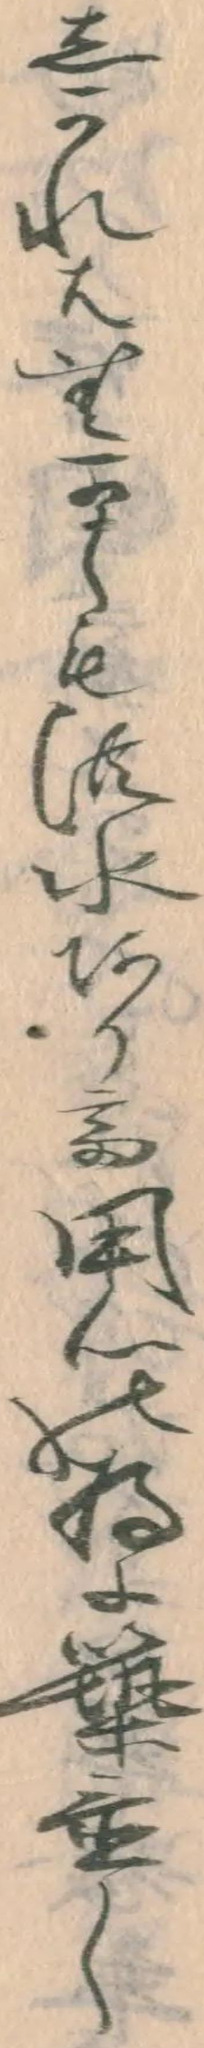しかれ共むかしも洪水ありて用心の為に築置し
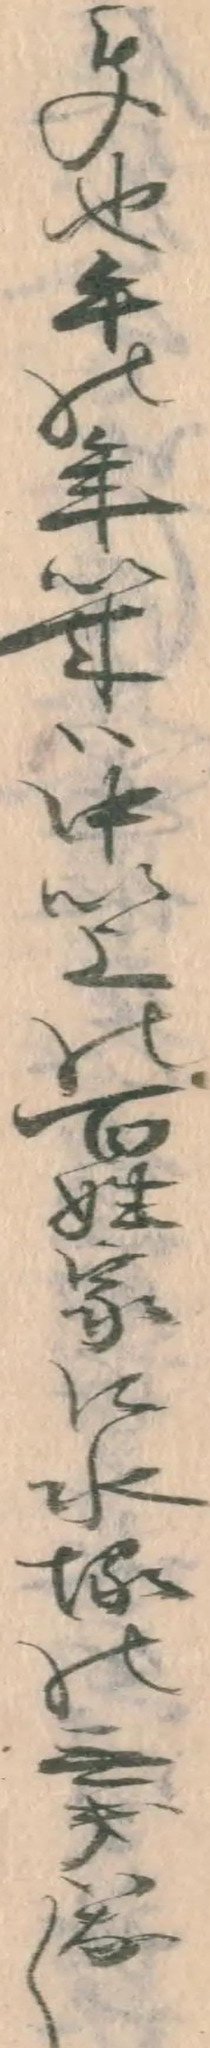もの也午の年以来は中以上の百姓家に水塚の無きはなし
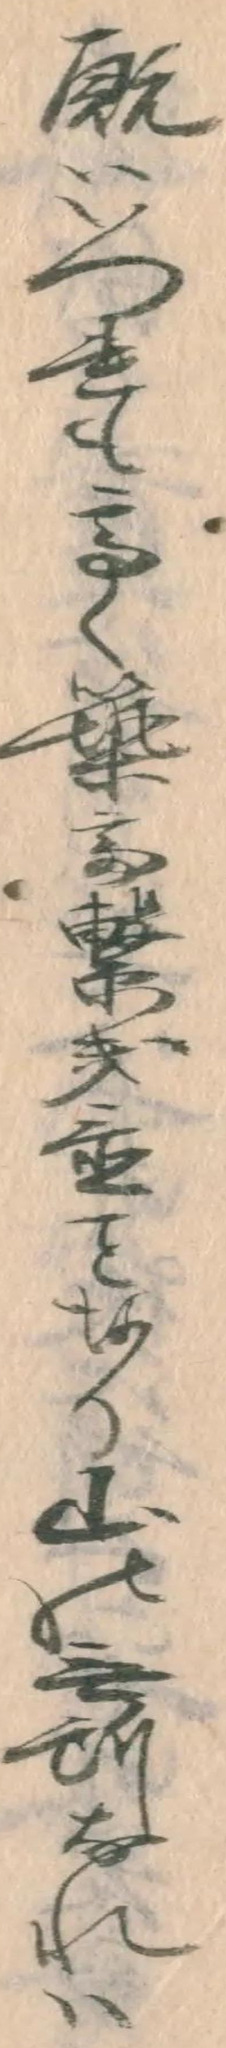厩はいつれも高くて繋き置ことなり山の無所なれは
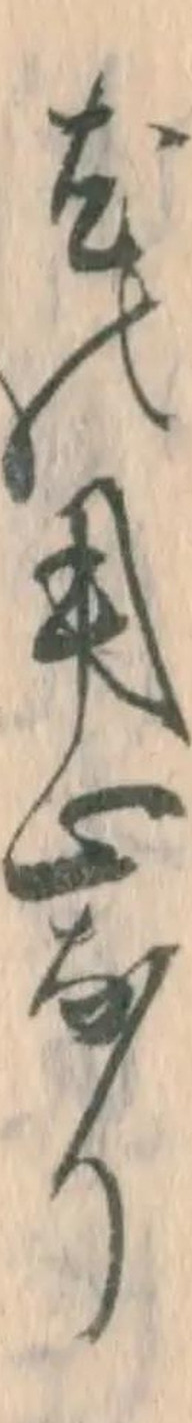尤の用心なり
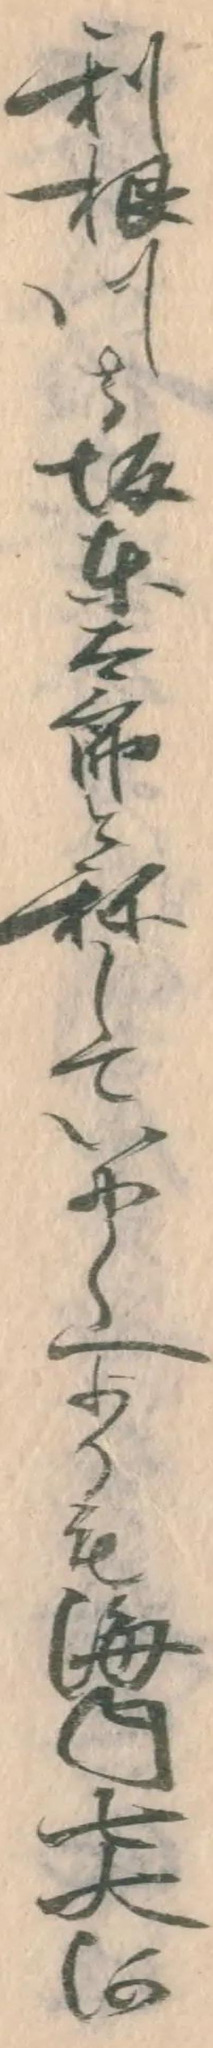利根川は坂東太郎と称していにしへよりも海内七大河
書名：四神地名録 6巻. [4]葛飾郡
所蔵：国立国会図書館 National Diet Library, JAPAN
